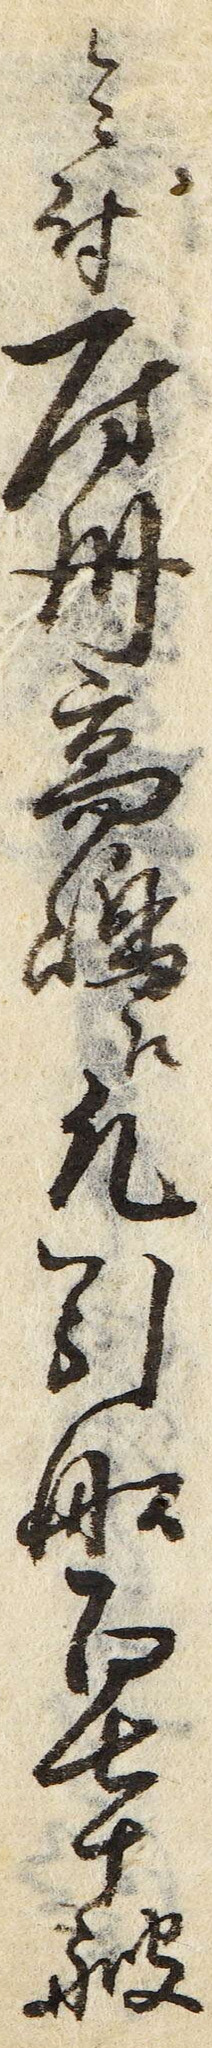候ニ付房州高嶋え凡引船百七十艘
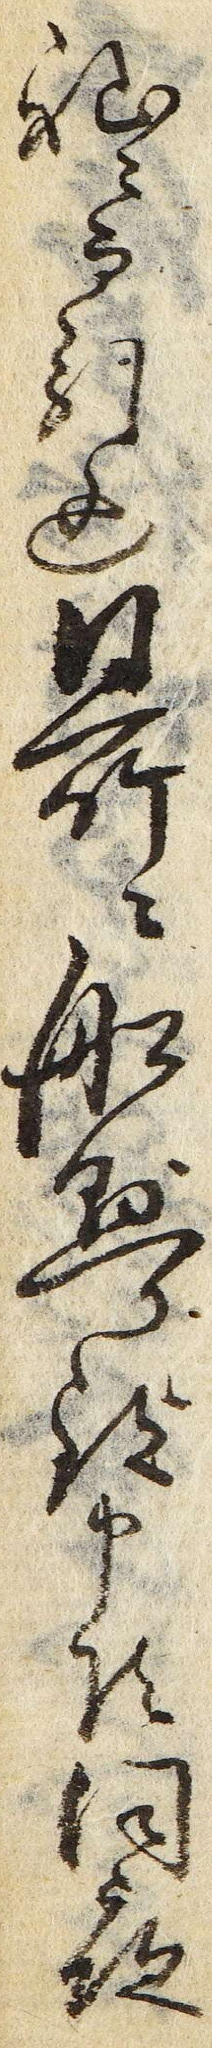程ニ而引込同所ニ船懸り致申候同夜

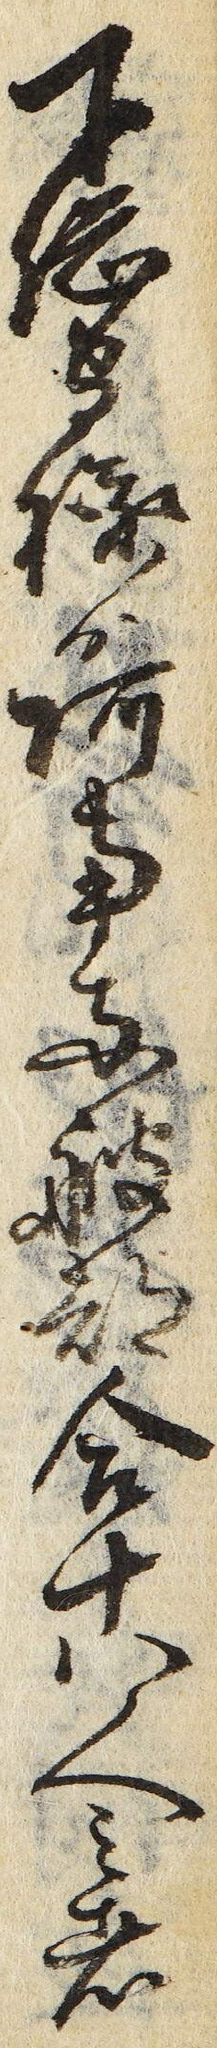下総守様ゟ阿南両艘都合十八人之者
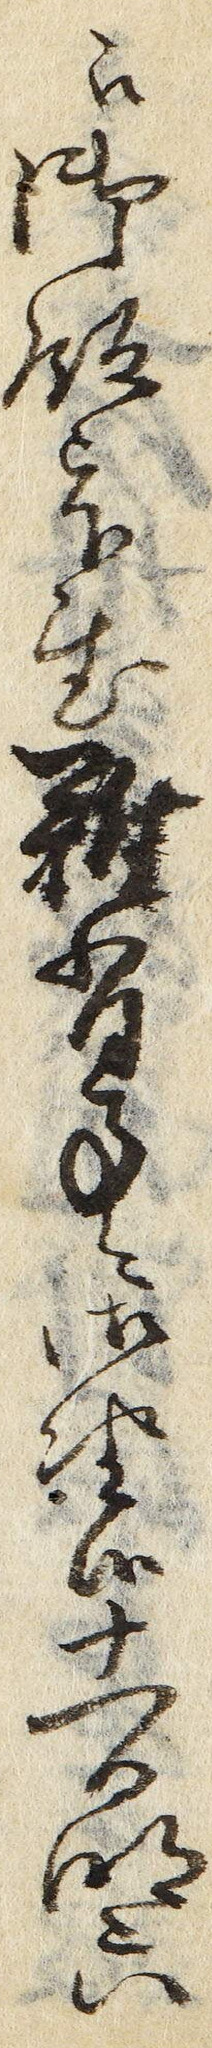江御飯被下置難有事ニ御座候十一日明六
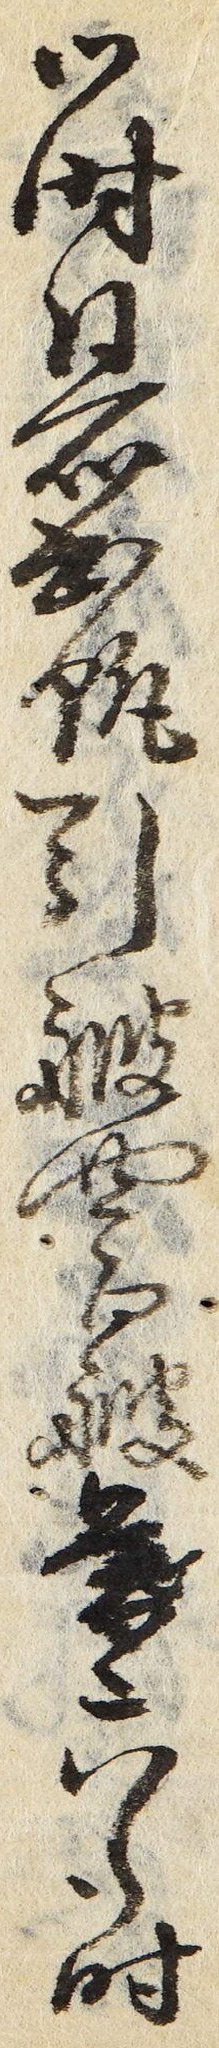ツ時同所出帆引艘四百艘暮六ツ時
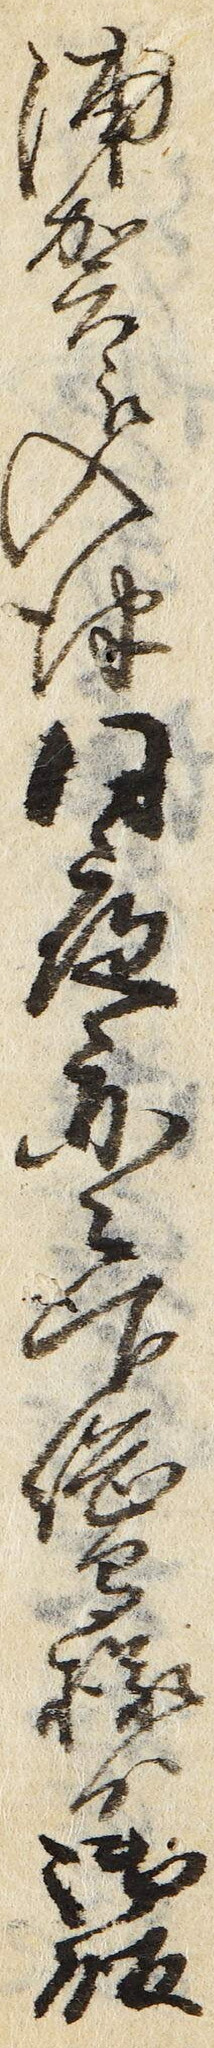浦賀え入津同夜亦々下総守様ゟ御飯
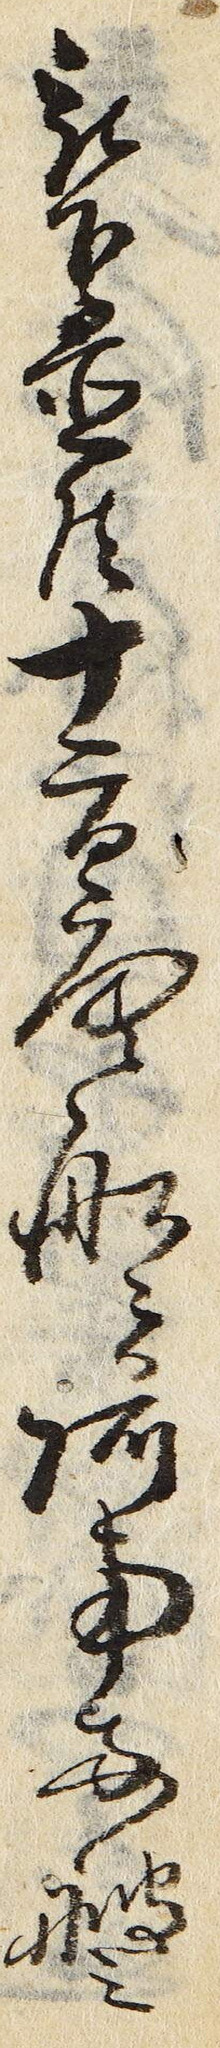被下置候十二日唐船ニ而阿南両艘之
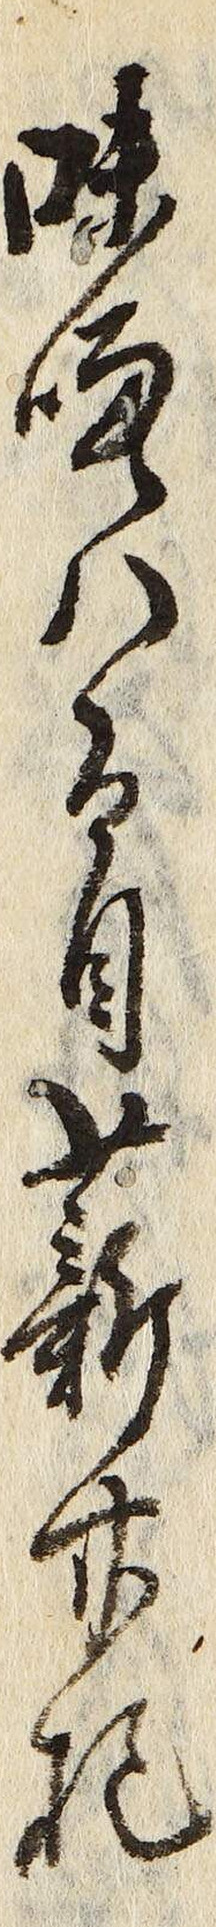味噌八百目薪廿把
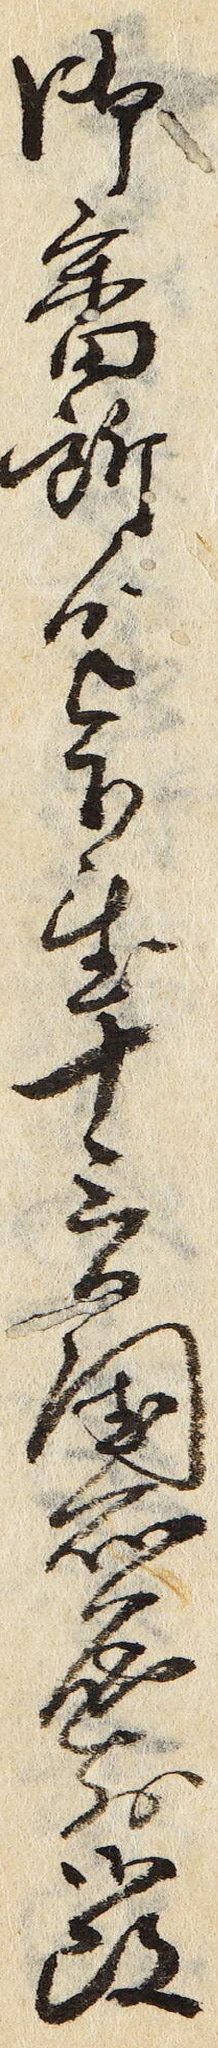御番所ゟ被下置十三日国所村御改
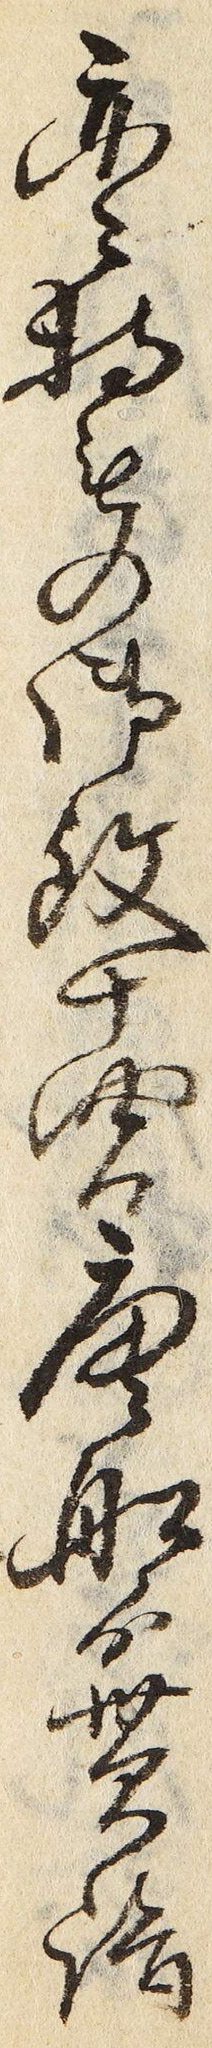亦々持もの御改十四日唐船ゟ貰請
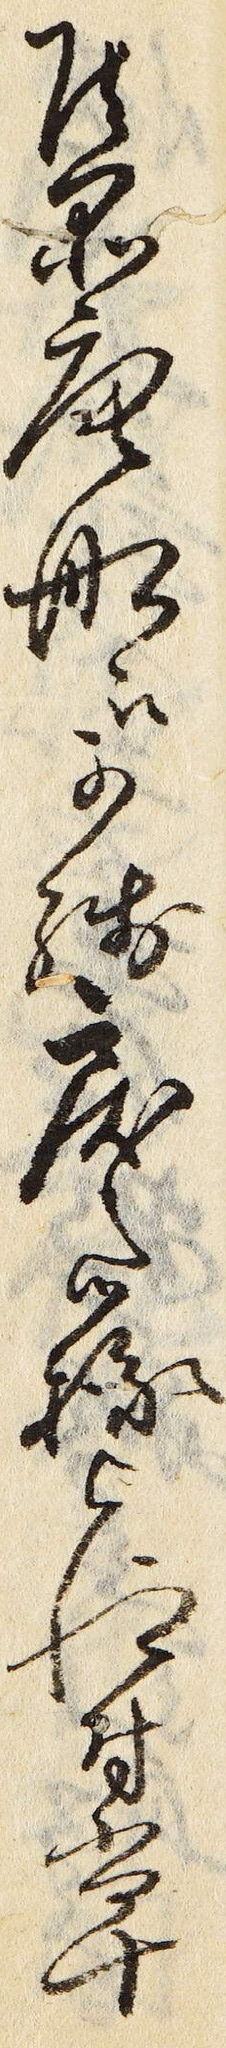候品唐船え不残戻し候様被仰付尚十
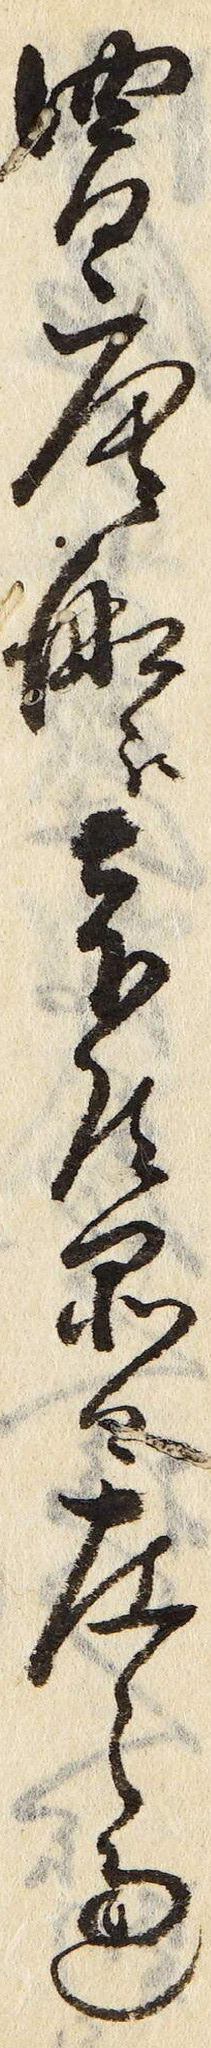四日唐船え被下候品々左之通
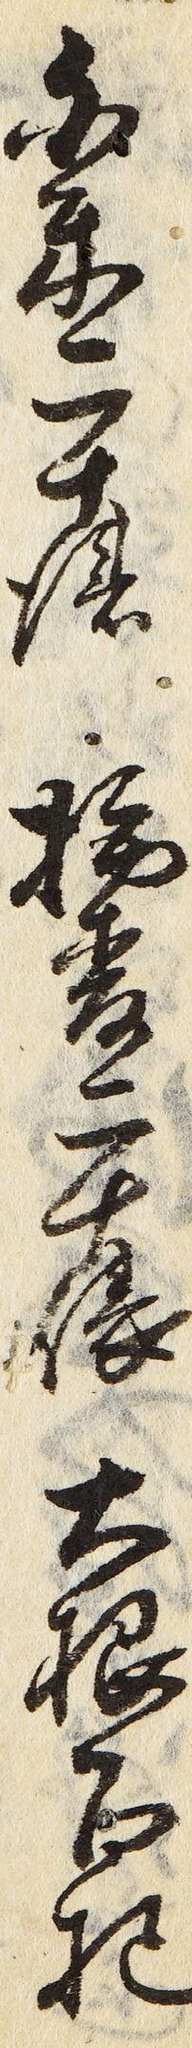白米二十俵麦二十俵大根百把
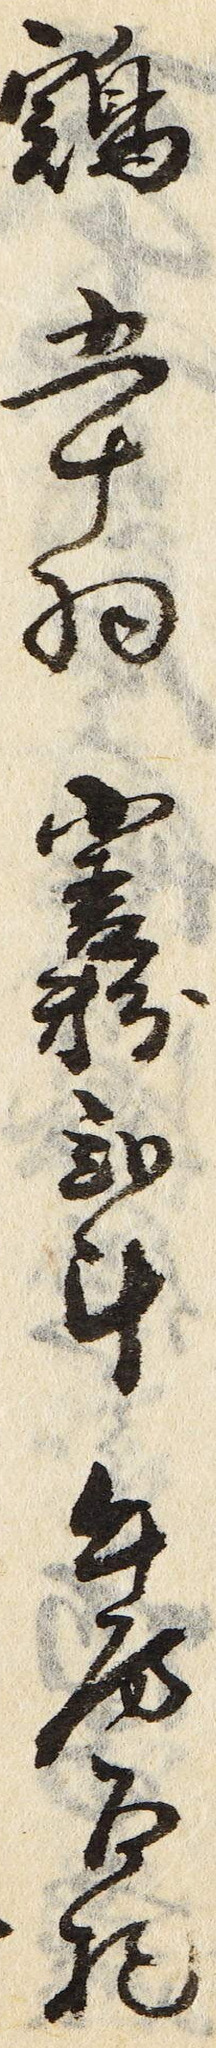鶴五十羽小麦粉似弐斗午房百把
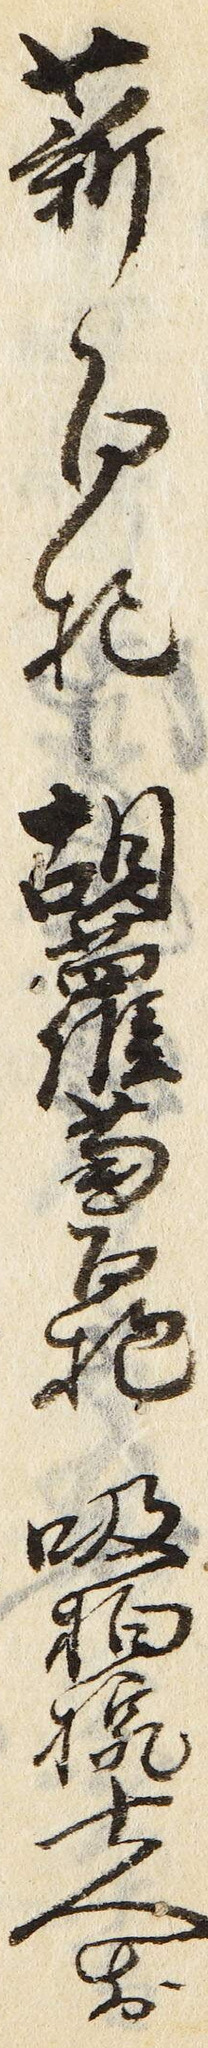薪百把胡蘿葡？百把吸物椀七人前
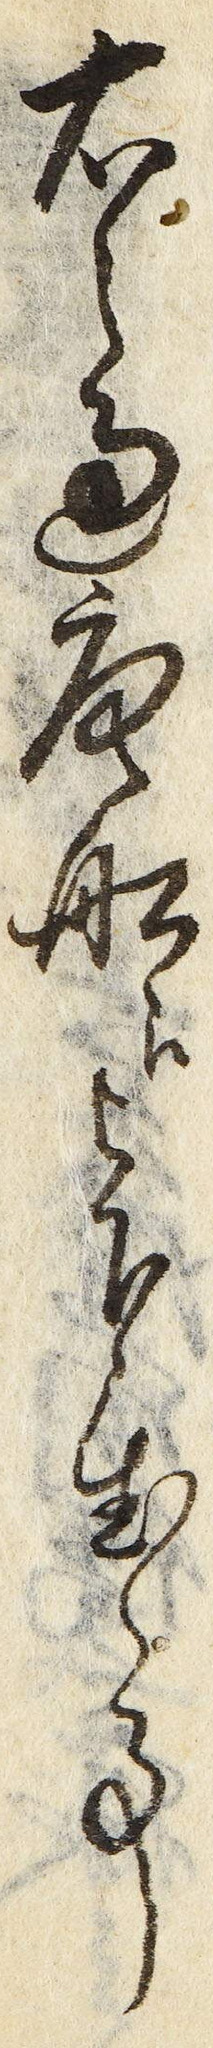右之通唐船え被下置候事
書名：阿波幸宝丸漂流記
